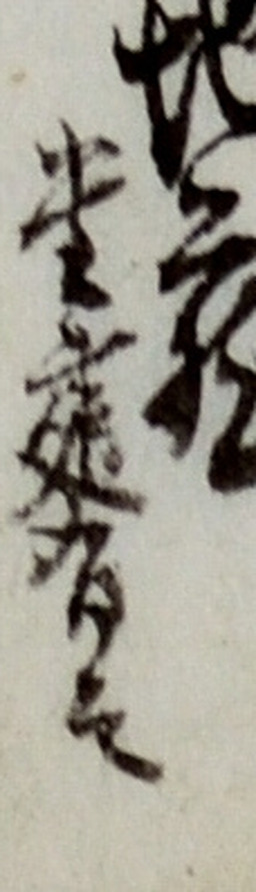宮建有之
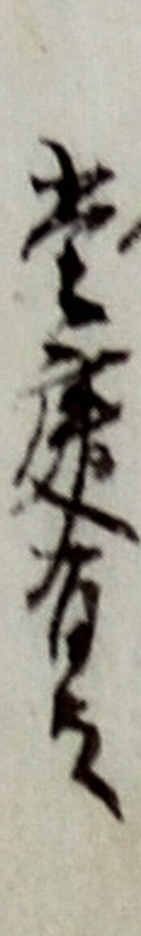宮建有之

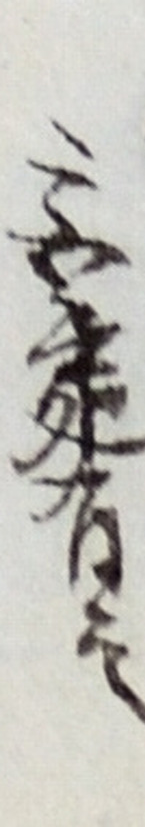宮建有之
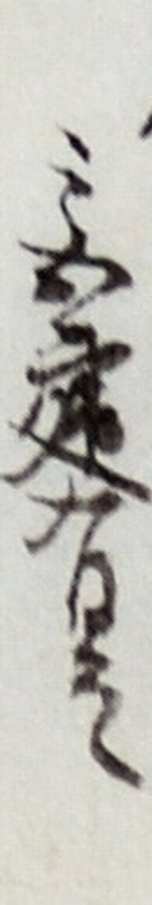宮建有之
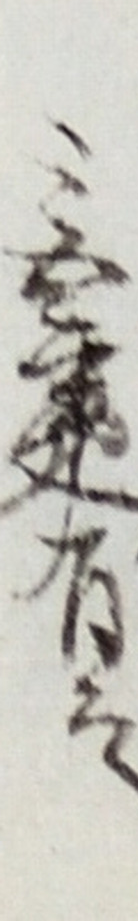宮建有之
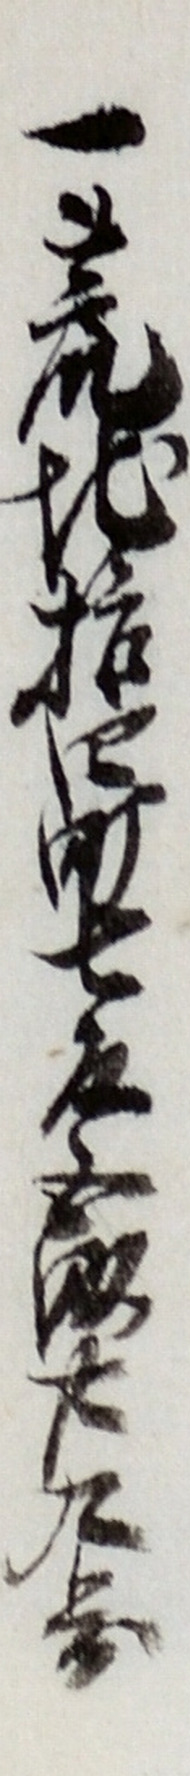一荒地拾四町七反五畝廿九歩村中
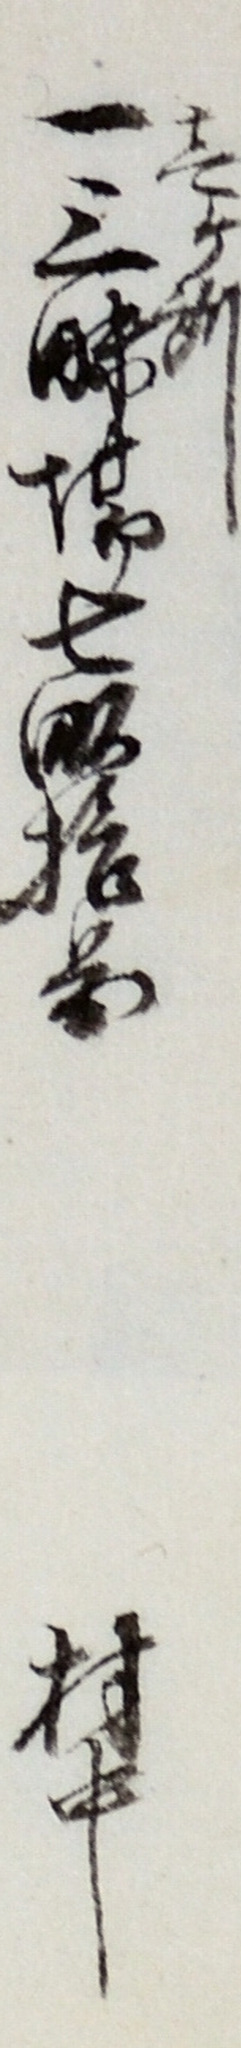一三昧場七畝拾歩村中
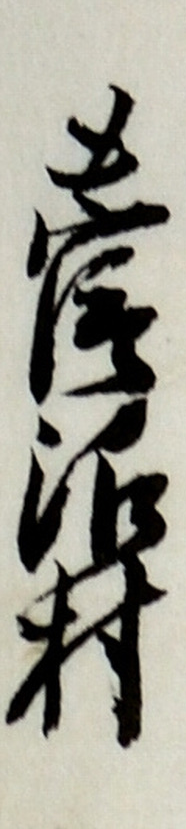菅沼村
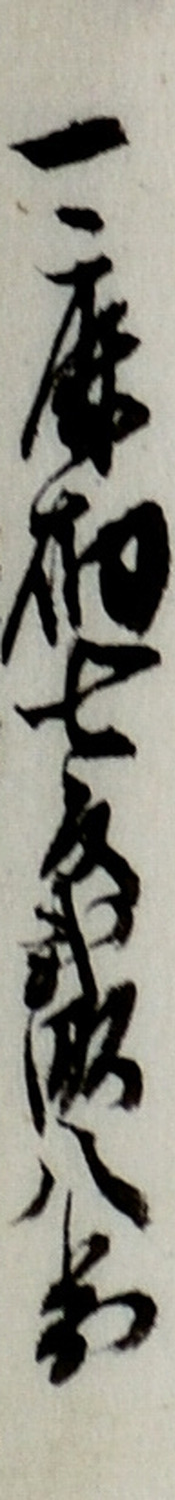一麻畑七反弐畝八歩
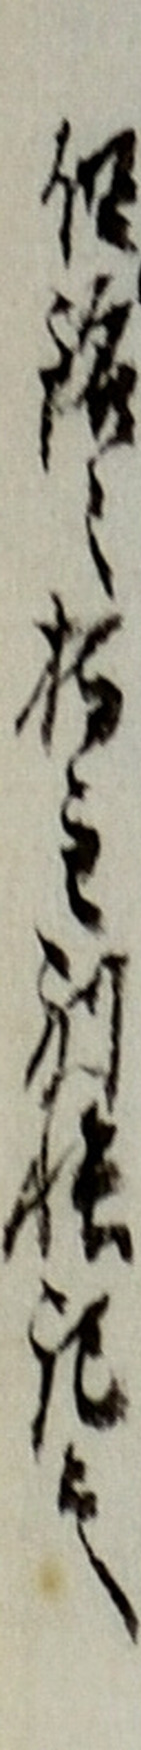但銘々持主別帳記之
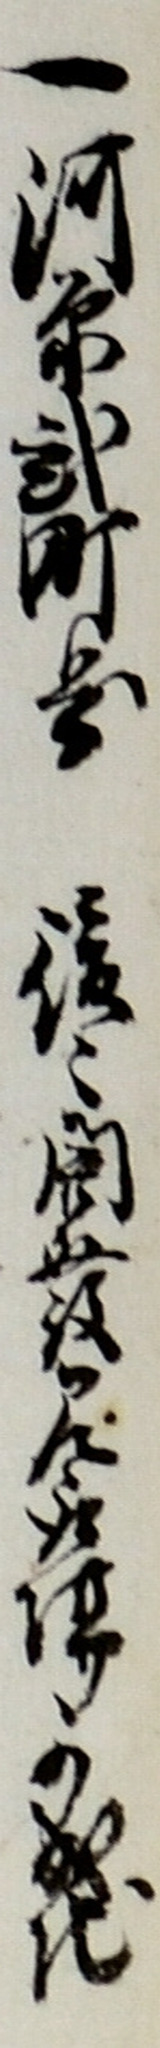一河原弐町歩後々開発見取場可成地
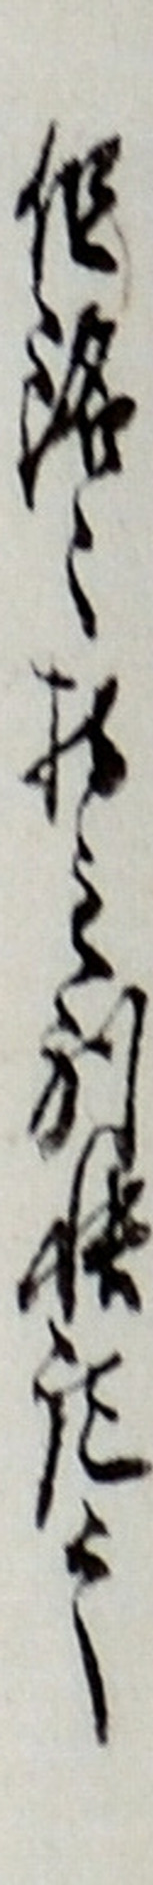但銘々持主別帳記之
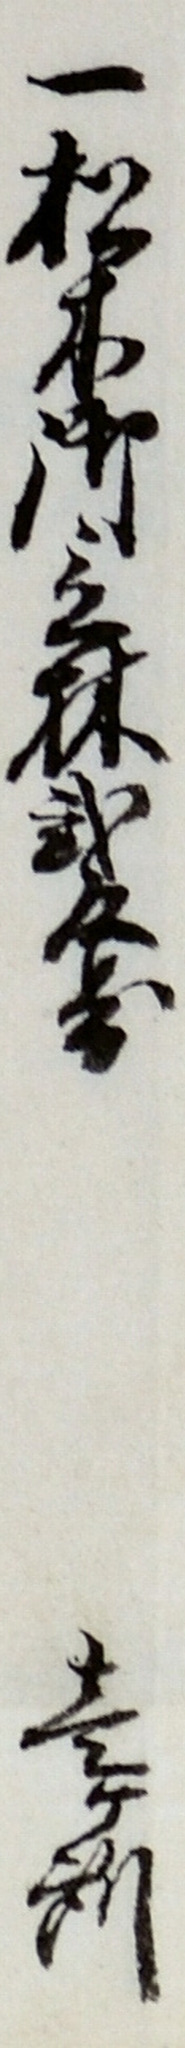一松木御立林弐反歩壱ヶ所
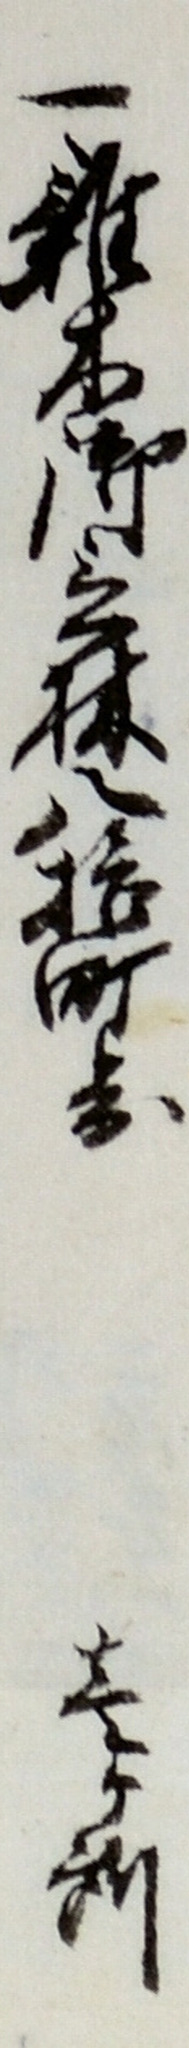一雑木御立林八拾町歩壱ヶ所
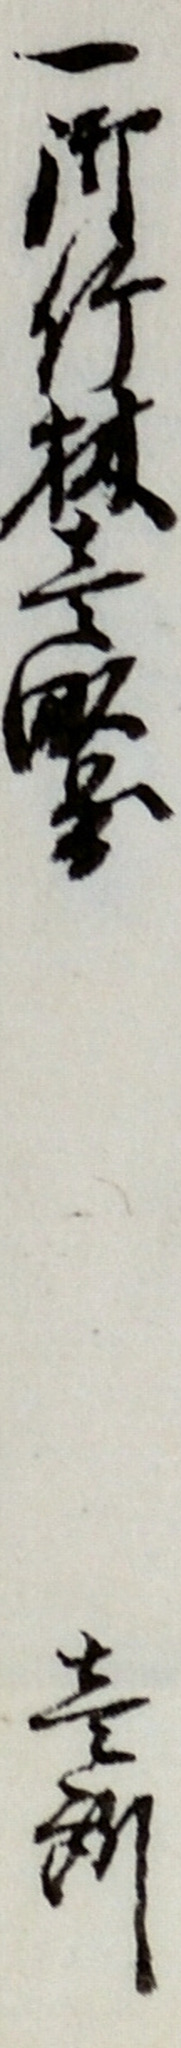一御竹林壱畝歩壱所
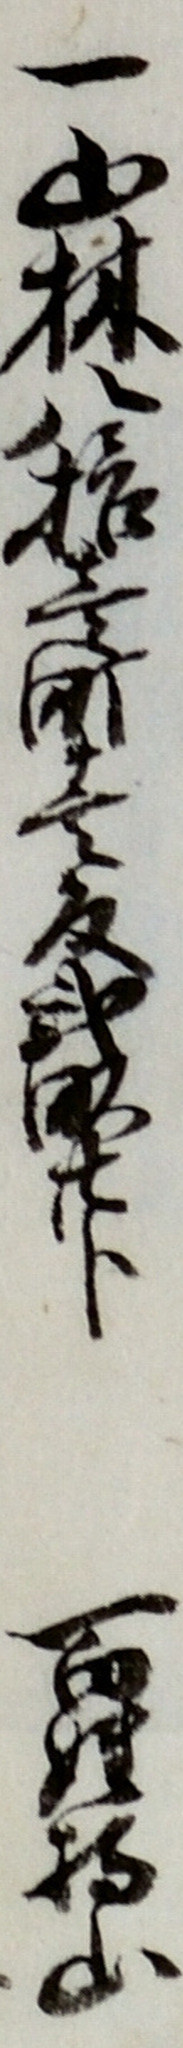一山林八拾壱町壱反弐畝廿歩百姓持山
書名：御領分中山林社地手控
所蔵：伊那市立高遠町図書館・合同会社AMANE
